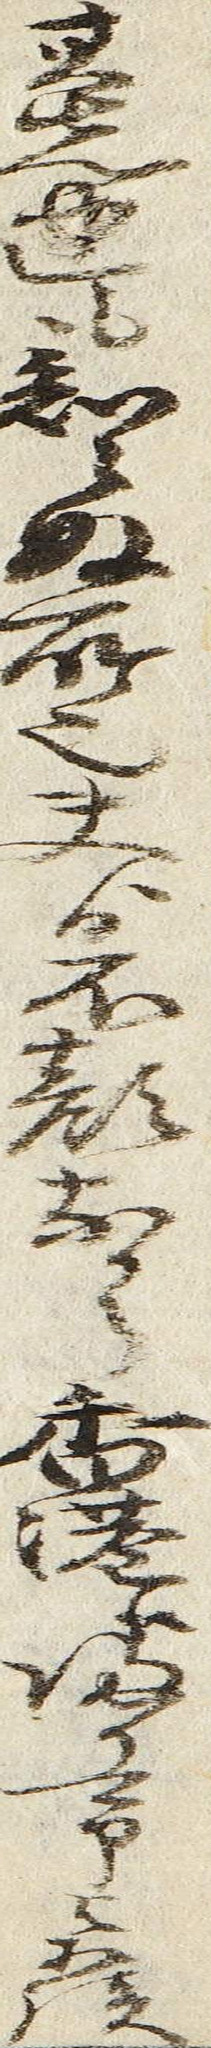其先迚も知らぬ所也夫ゟ不顔府都？なりしか香港江帰り可申と相談
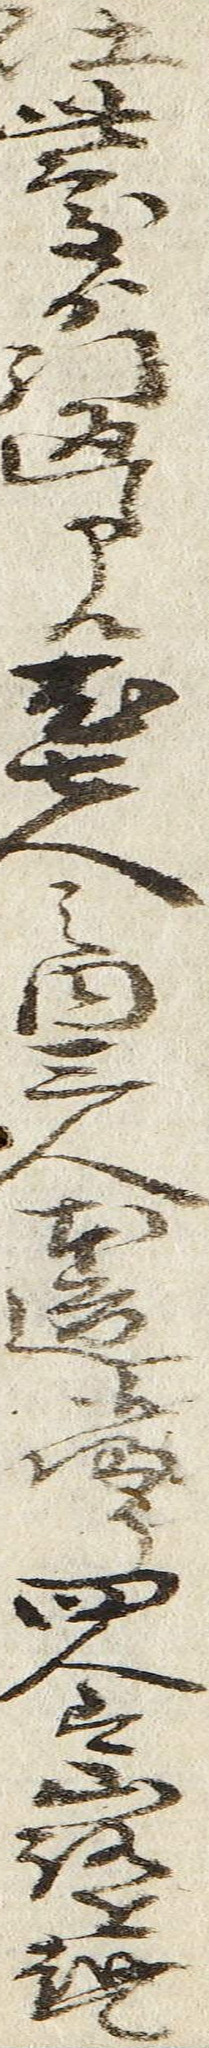仕此処ゟ引返し申候尤七人之内三人本道江帰り四人は山路を越て
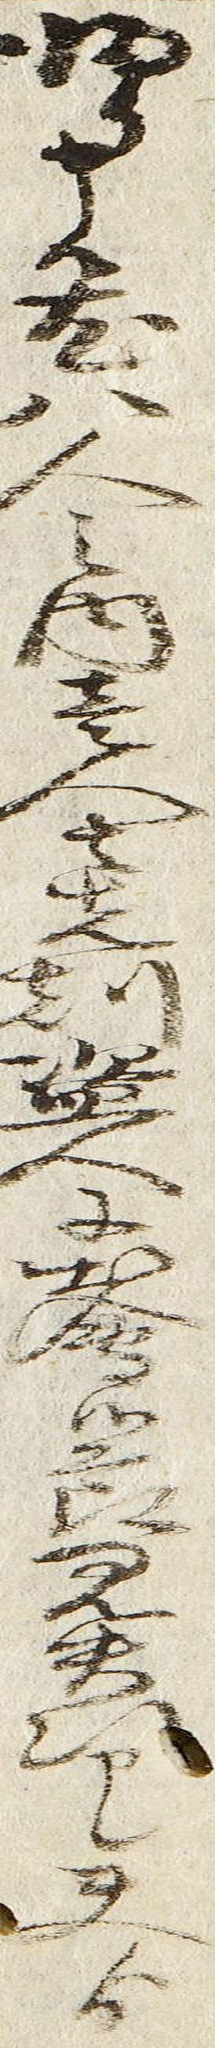帰り申候尤八人之内壱人は先刻盗人に出会候節見失ひ申候夫ゟ
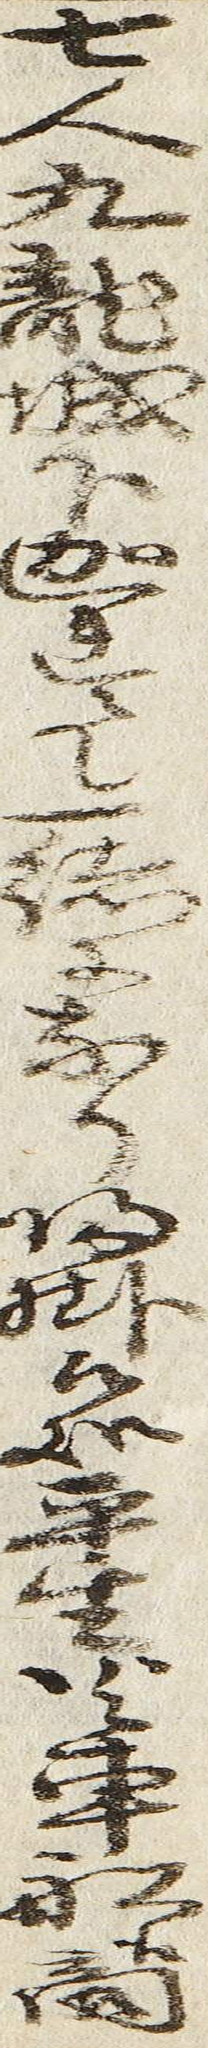七人九龍城下ヵ迦連？にて一緒になり帰掛候処平生火車船江商
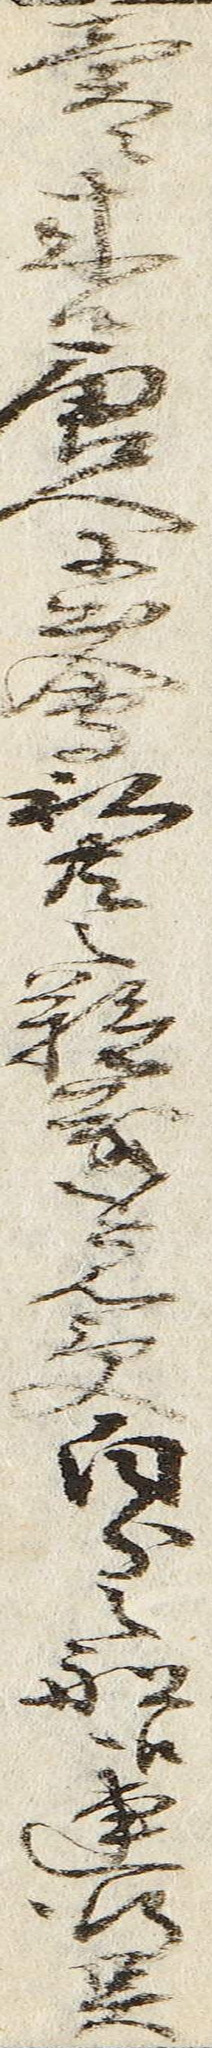売に来候唐人に出会私共之難義を見受自ら之船江連行呉
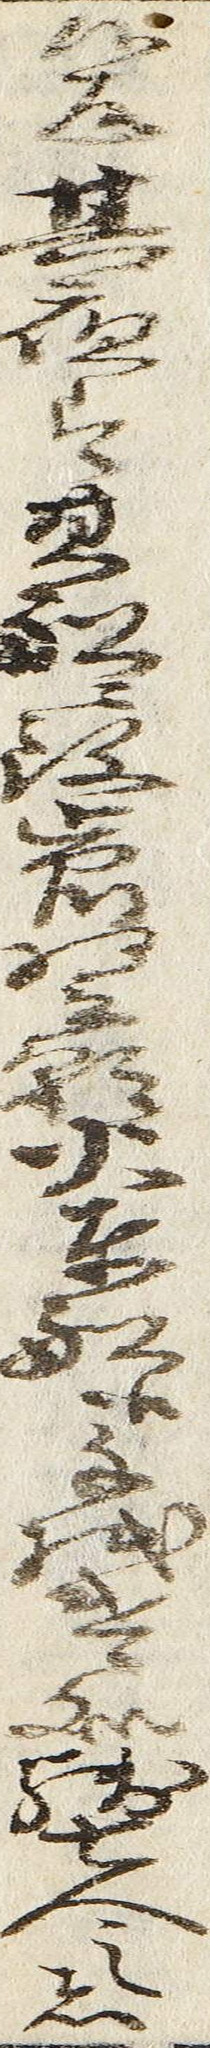候故其夜は其船に致止宿翌朝火車船江手紙遣候処残七人之者
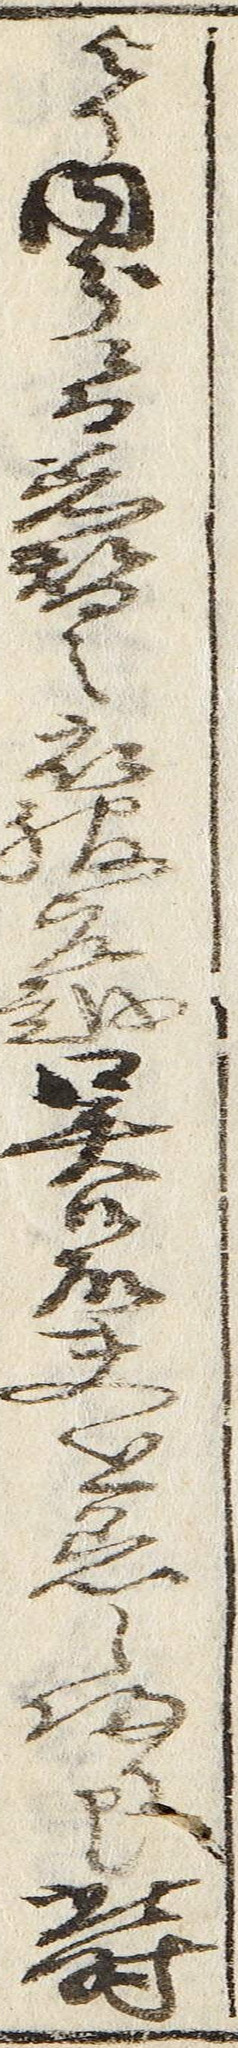より内分に而着替之衣服差越呉候故夫を着し帰り申候此時
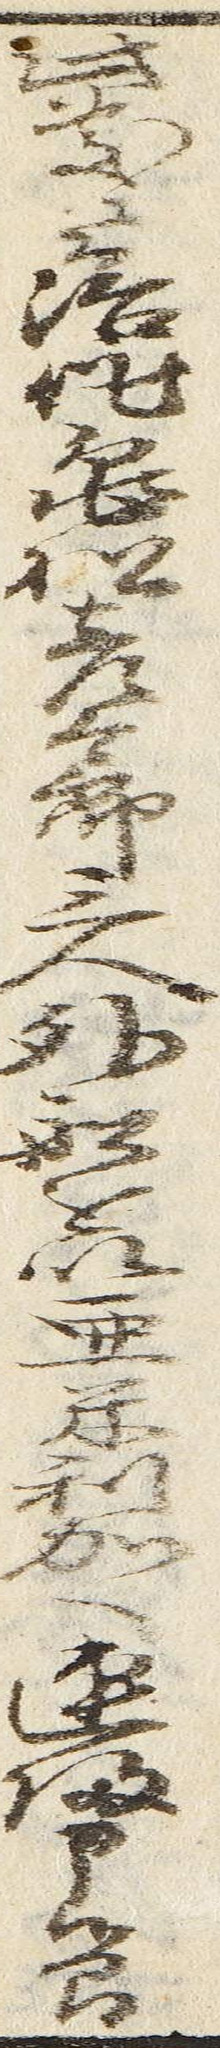此処に而治作亀松彦太郎三人外船を以亜米利加へ連帰申候間
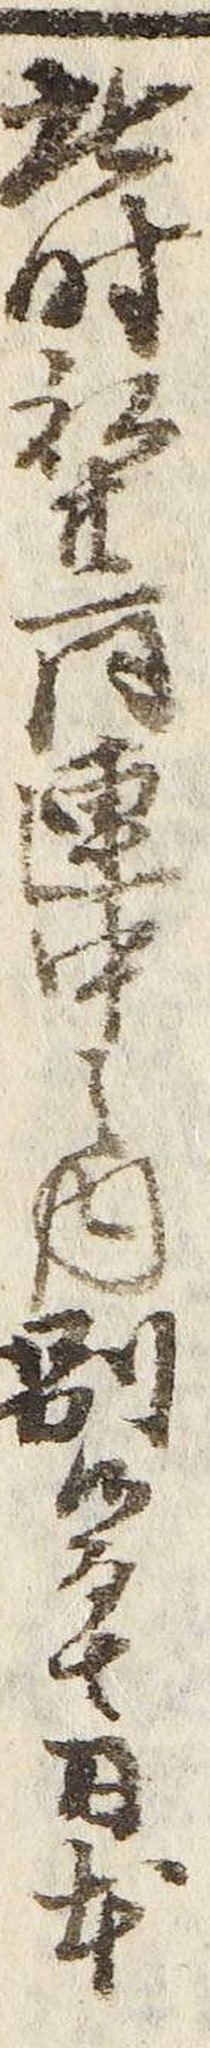此時私共一同連中と内別候而者日本
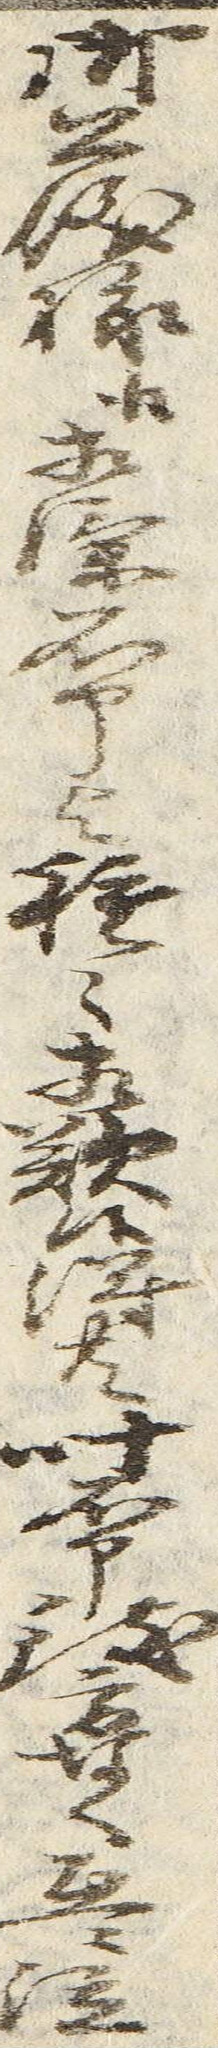御公儀様江相済不申と種々相歎候得共叶不申致方なく互に泣
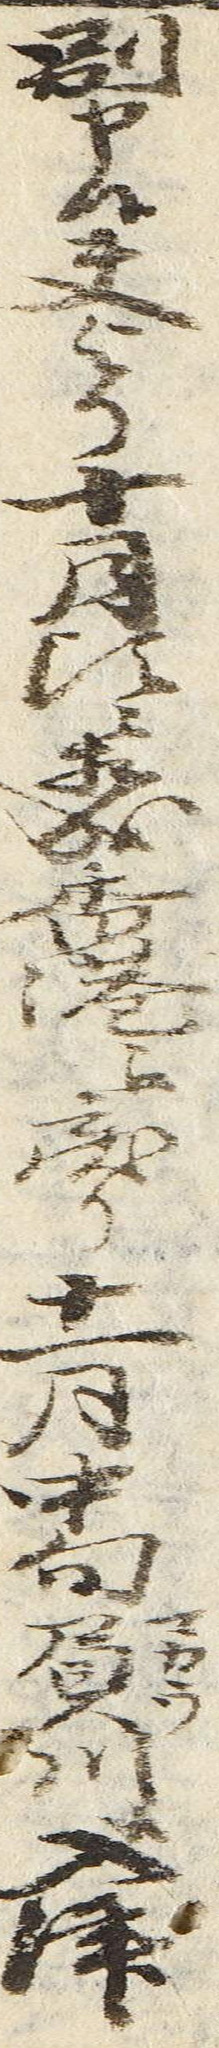別申候夫より十月頃に相成香港江戻り十一月中旬負川江入津
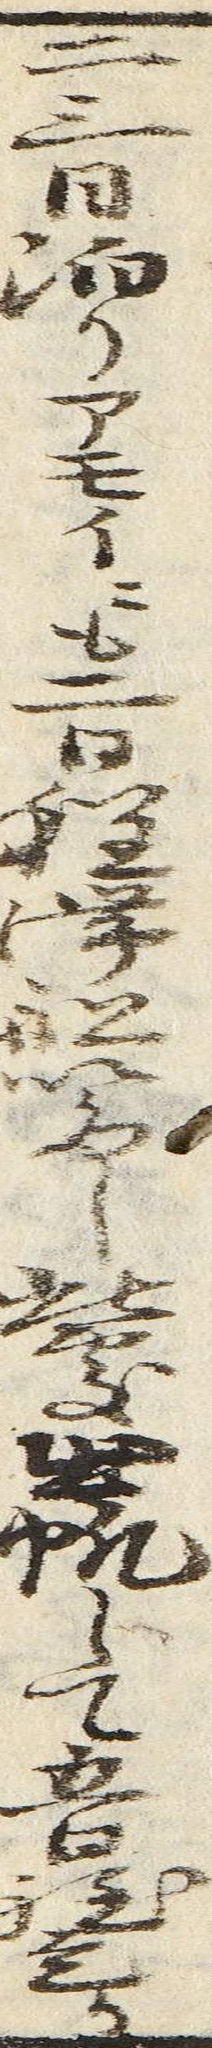二三日泊りアモイにも二日程滞船いたし此処出帆して五日程走り
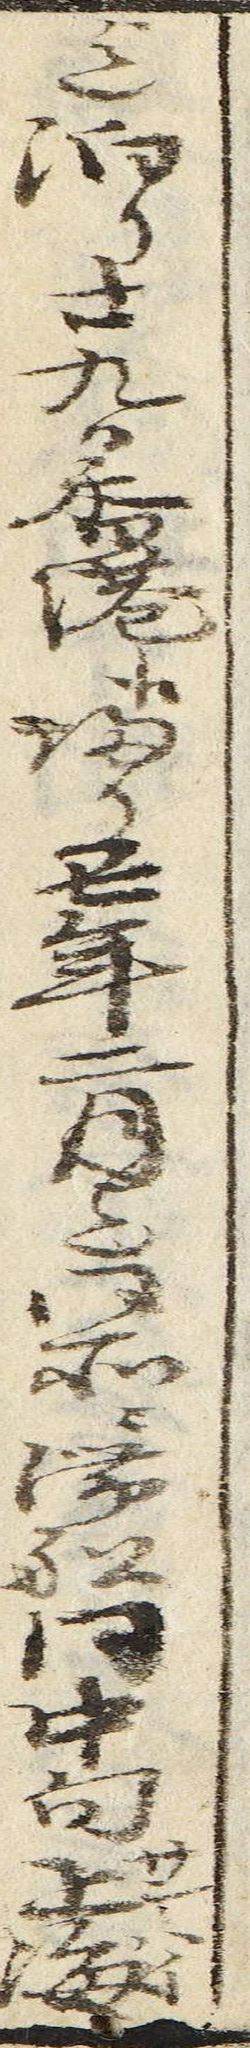迄泊り廿九日香港江帰り巳年二月迄同所に滞船同中旬上海

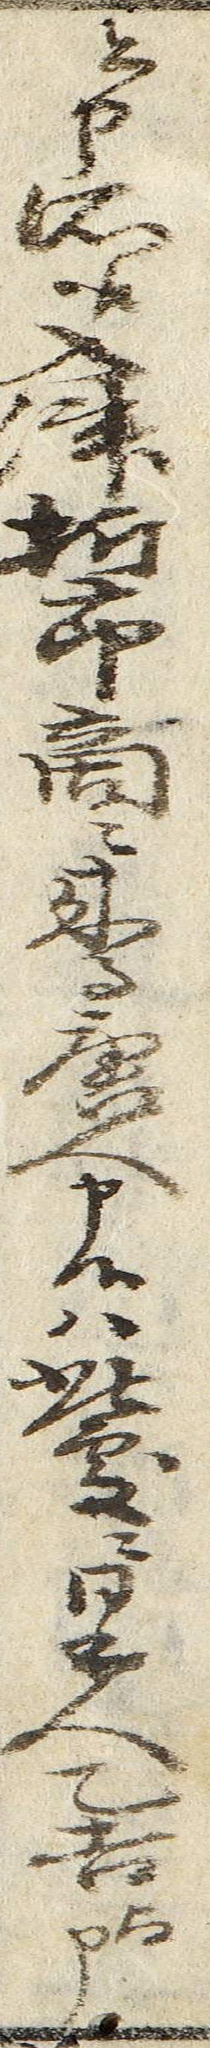と申所江入津折節商に来る唐人申候は此処に日本人乙吉と申
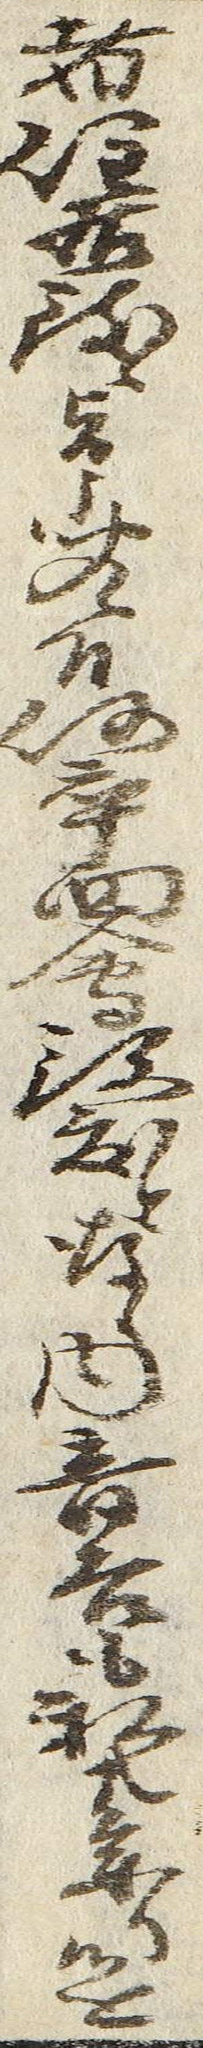者住居致候旨被申聞候付何卒面会致度と存候内音吉も私共参り候を
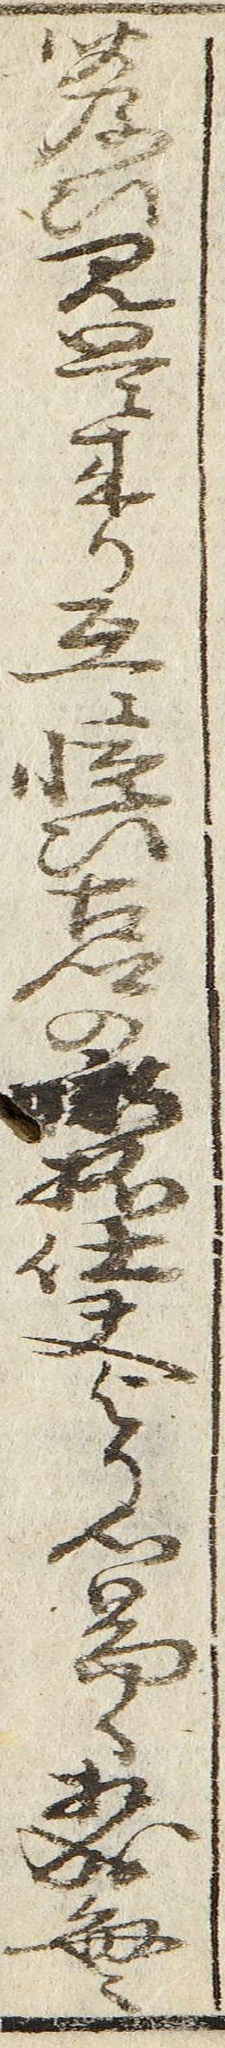聞及ひ見廻に来り互に悦ひ古郷の噺抔仕夫より心易く相成り毎々
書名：漂流夢物語
